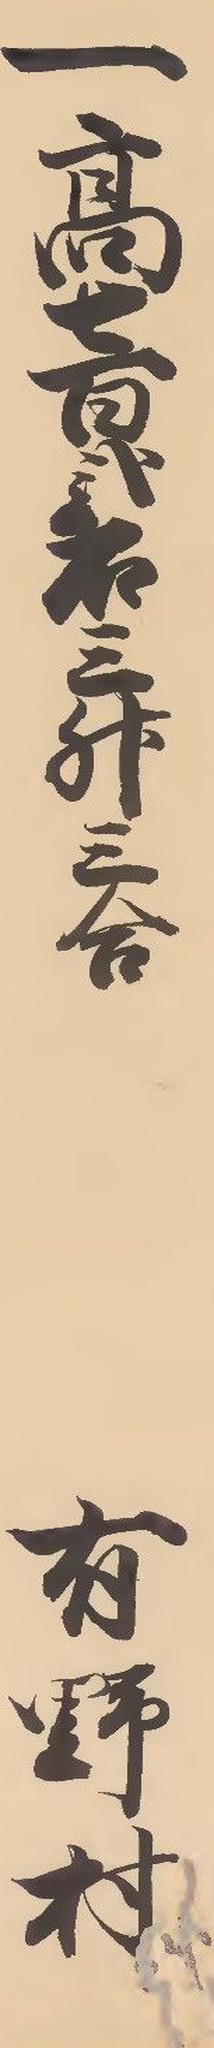一高七百弐石三升三合有野村
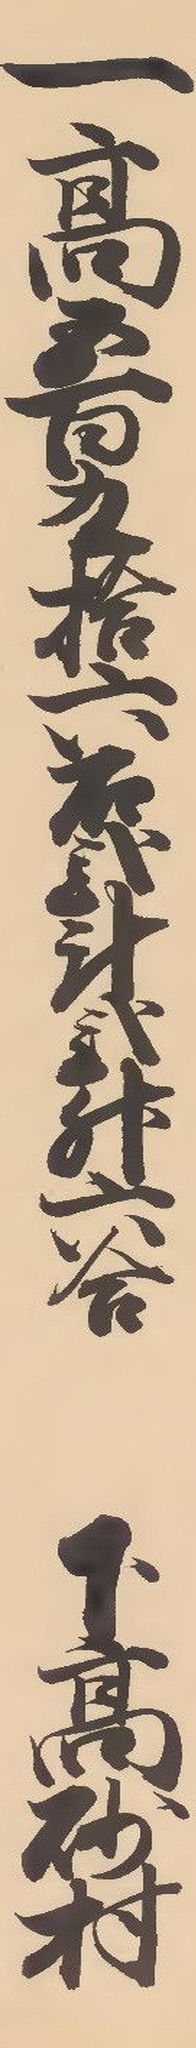一高五百九拾六右弐斗弐升六合下高砂村
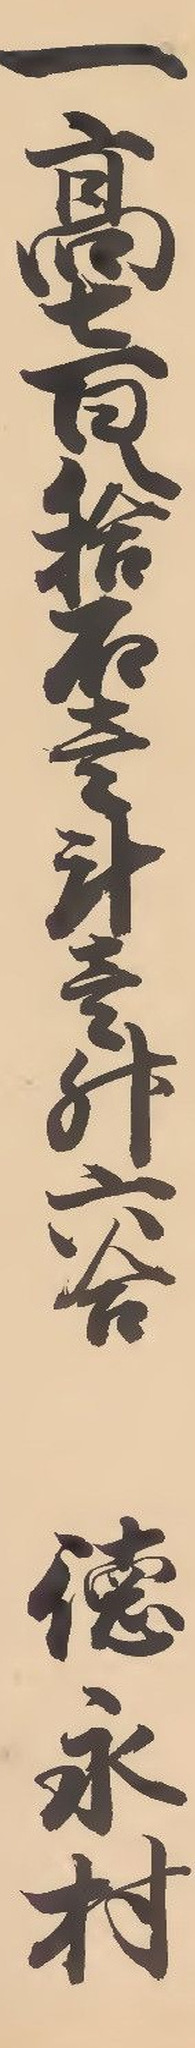一高七百八拾石壱斗壱升六合徳永村
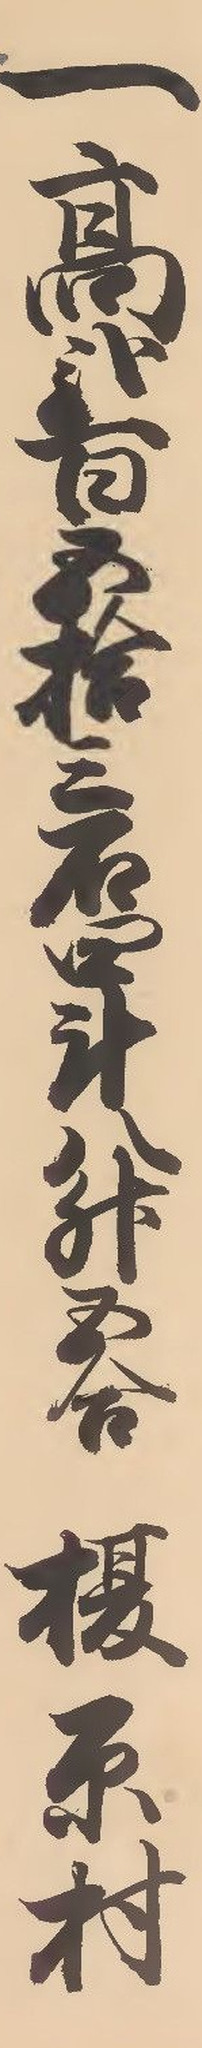一高弐百五拾三石四斗八升五合榎原村
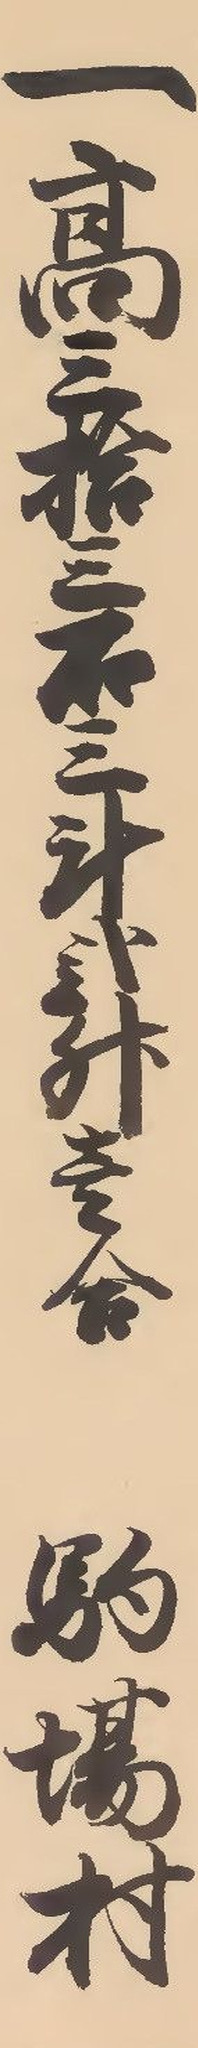一高三拾三石三斗弐升壱合駒場村
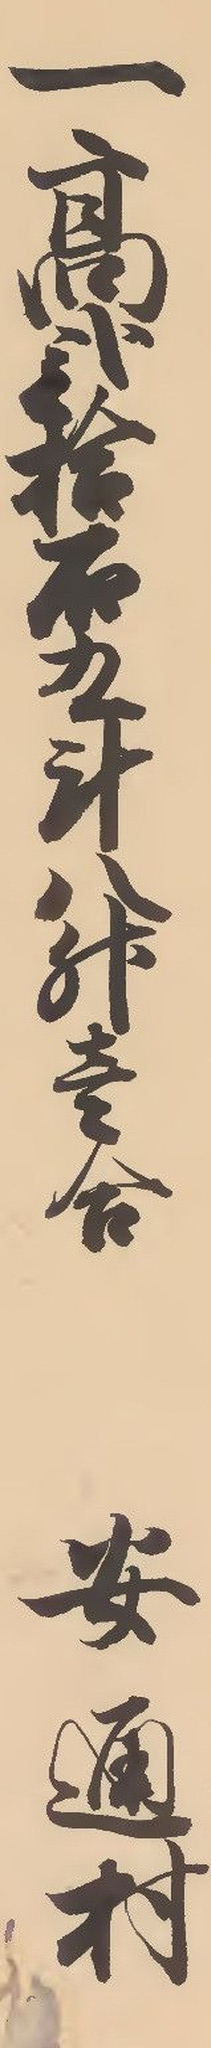一高弐拾石九斗八升壱合安通村
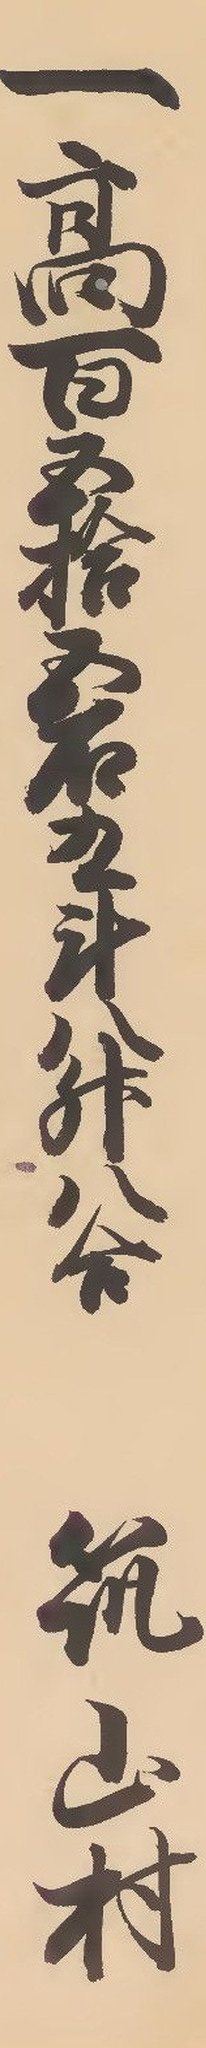一高百五拾五石九斗八升八合筑山村

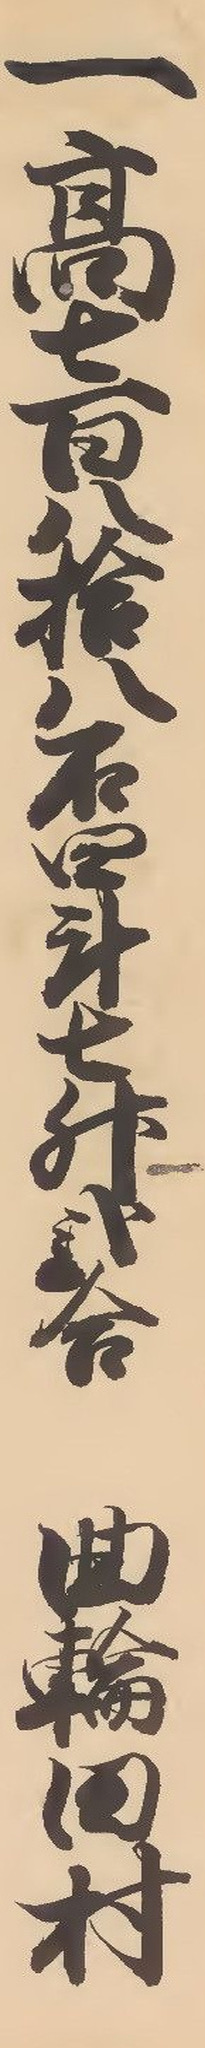一高七百八拾八石四斗七升弐合曲輪田村
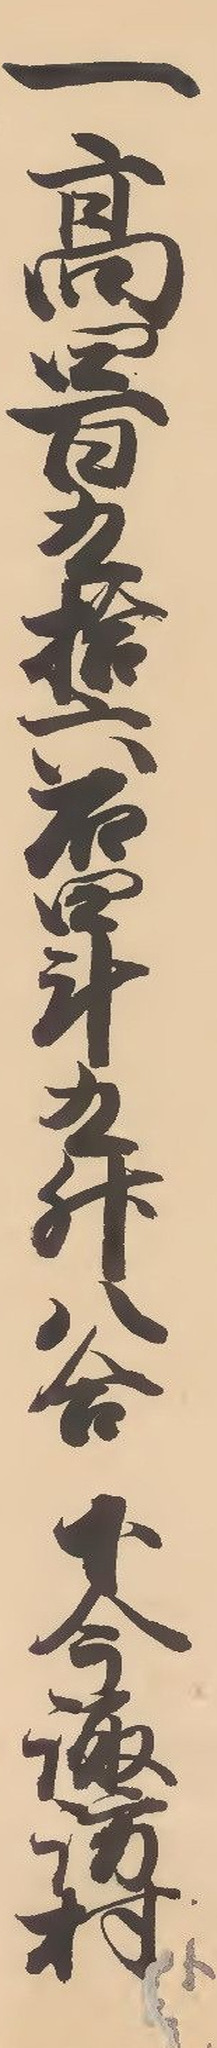一高四百九拾六石四斗九升八合下今諏訪村
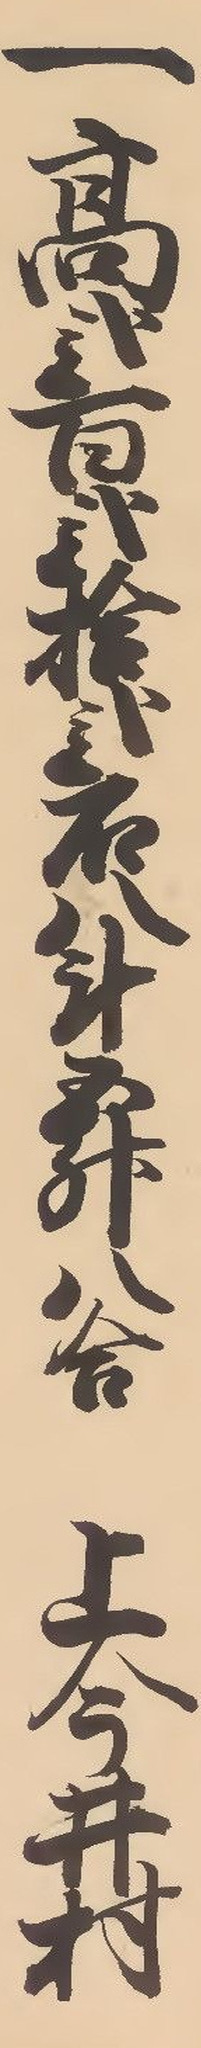一高弐百弐拾弐石八斗五升八合上今井村
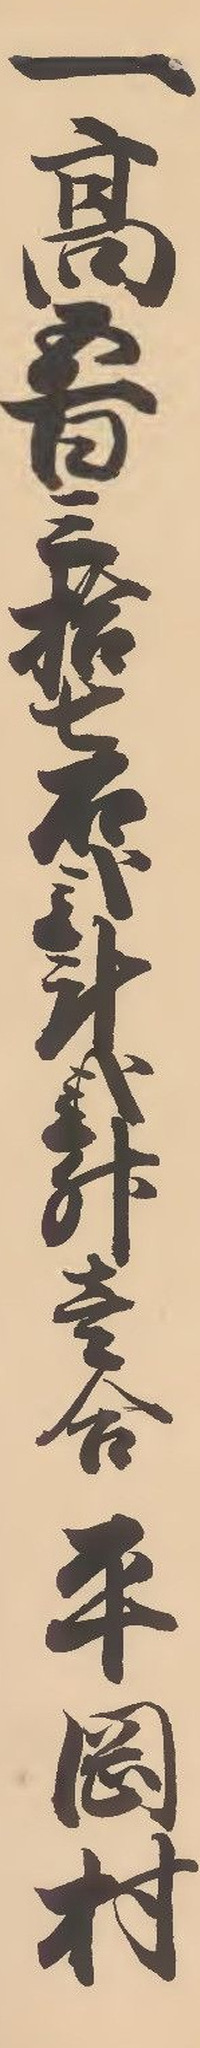一高五百三拾七石弐斗弐升壱合平岡村
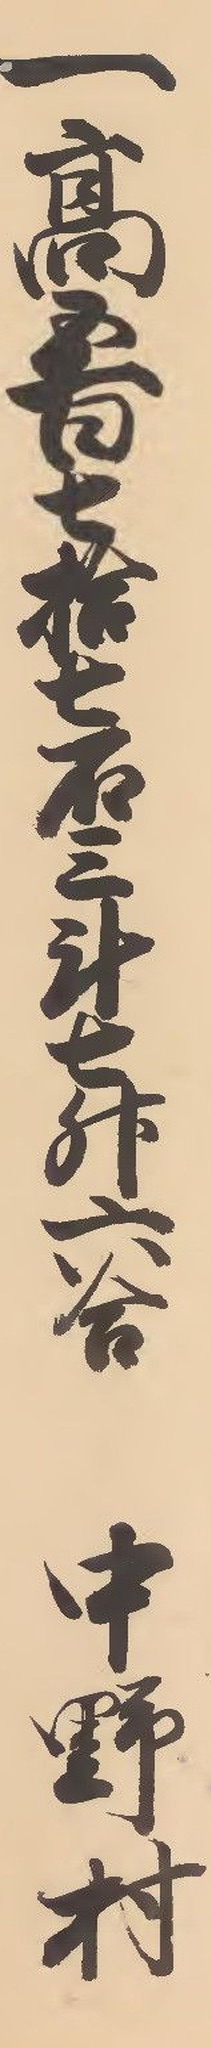一高五百七拾七石三斗七升六合中野村
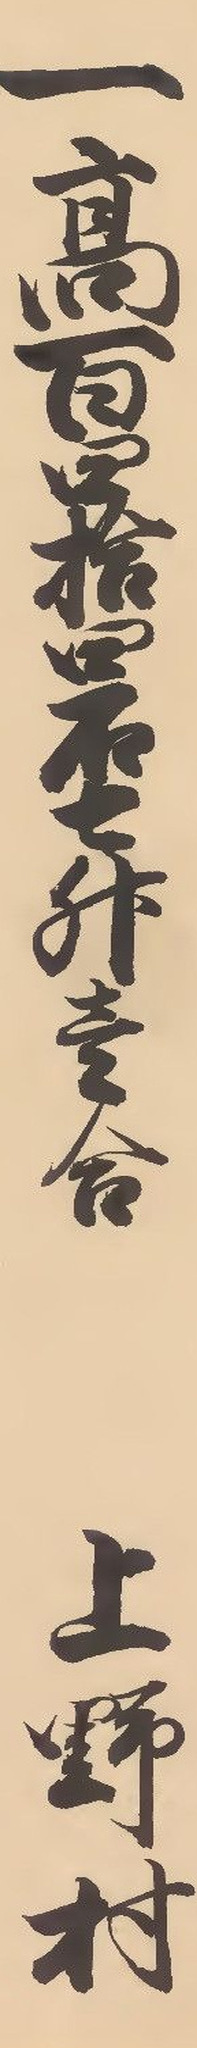一高百四拾四石七升壱合上野村
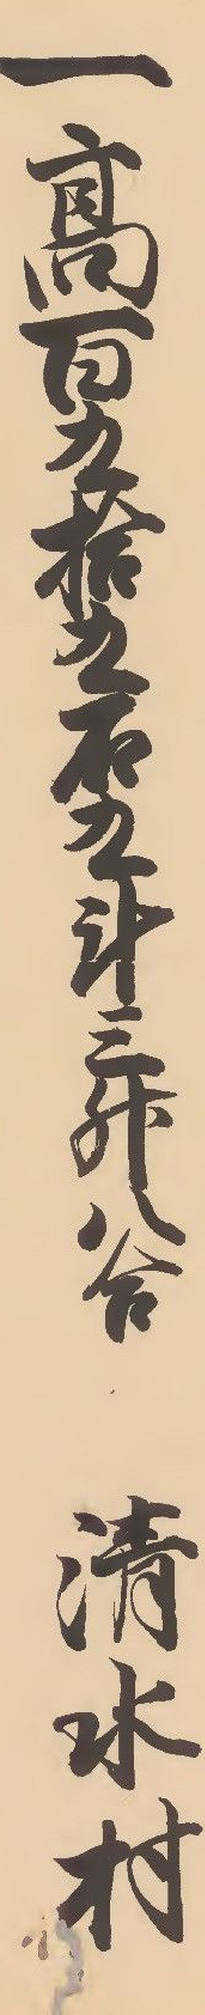一高百九拾九石九斗三升八合清水村
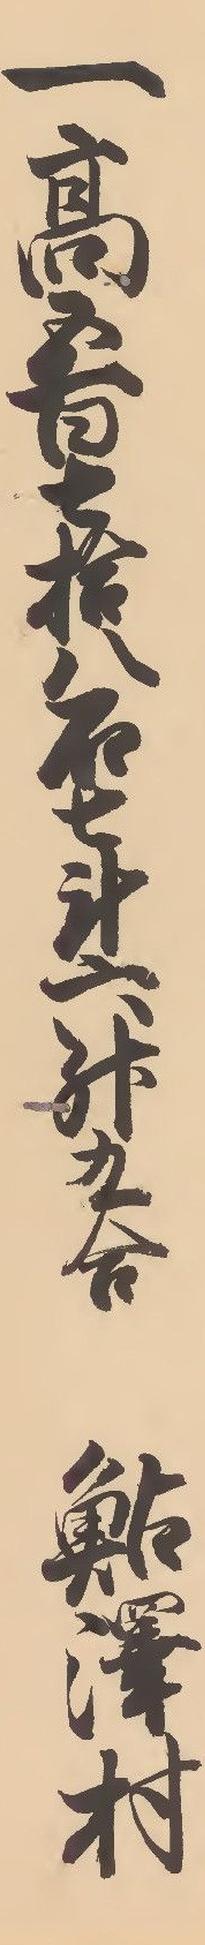一高五百七拾八石七斗六升九合鮎沢村

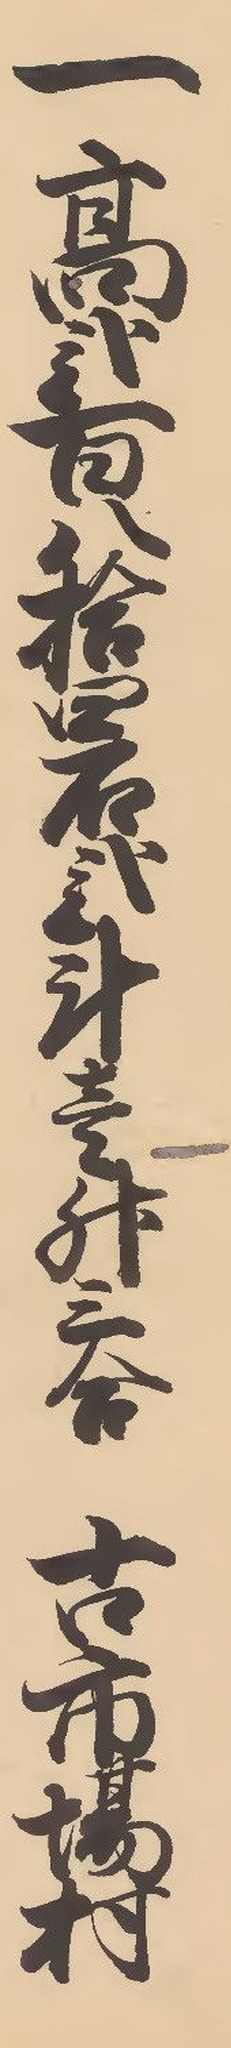一高弐百八拾四石弐斗壱升三合古市場村
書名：甲斐国郷帳
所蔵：国立公文書館 National Archives of Japan
